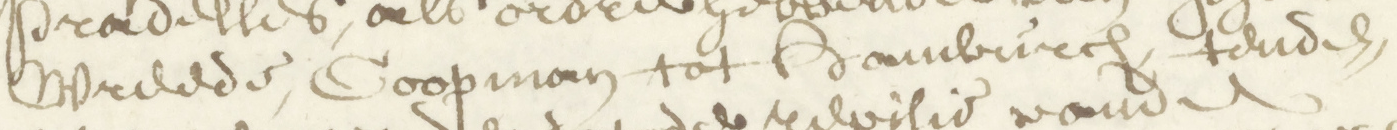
Wreede, Coopman tot Hamburch, tende„
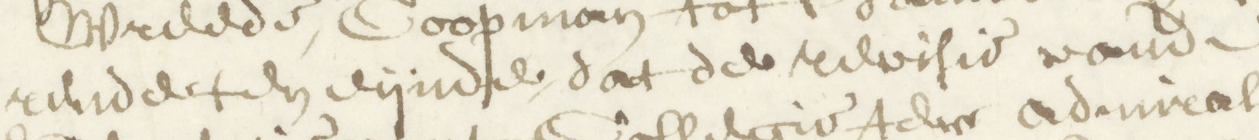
rende ten eijnde, dat de revisie vande
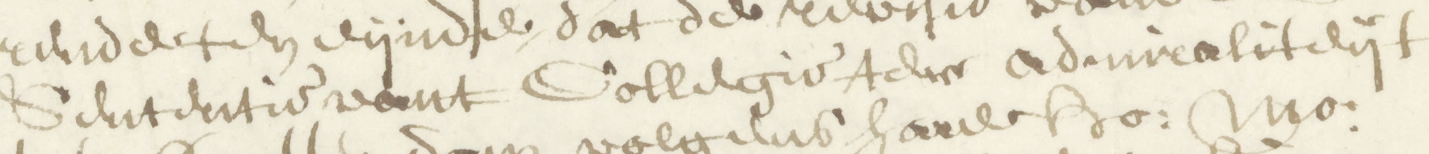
Sententie vant Collegie ter Admiraliteijt
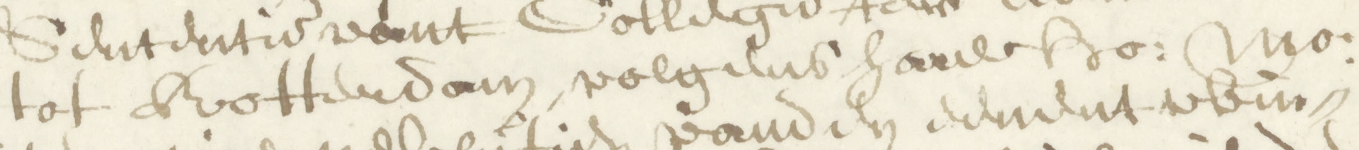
tot Rotterdam, volgens hare Ho:Mo:
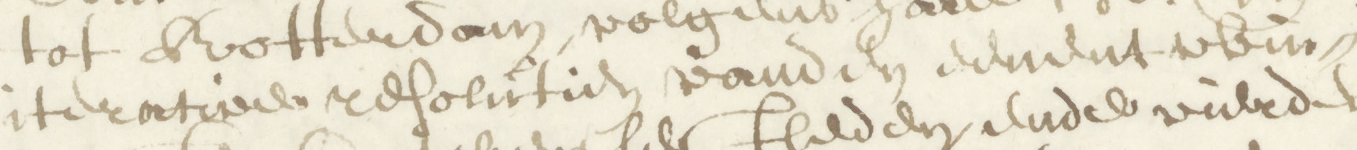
iterative resolutien vanden eenentwin„
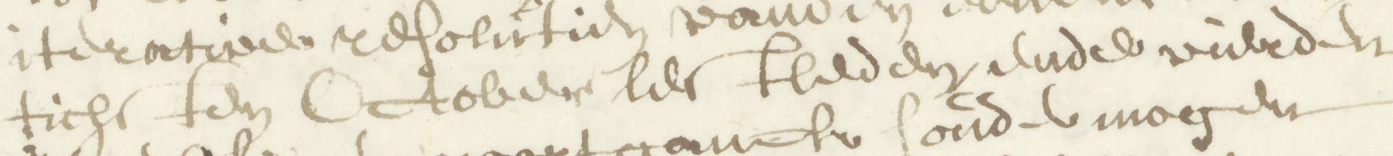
tichsten October lestleden, ende vierden
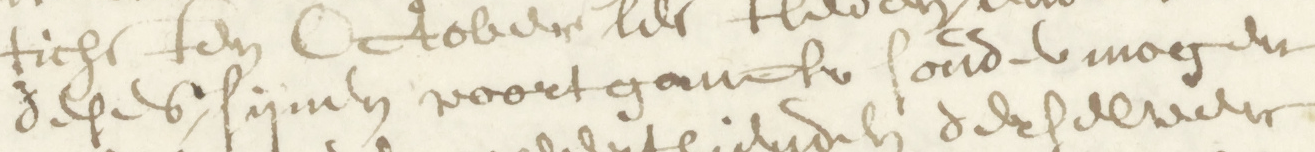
deses, sijnen voortganck soude mogen
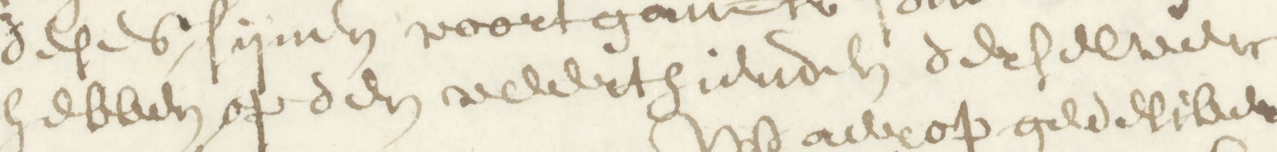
hebben, op den veerthienden derselver
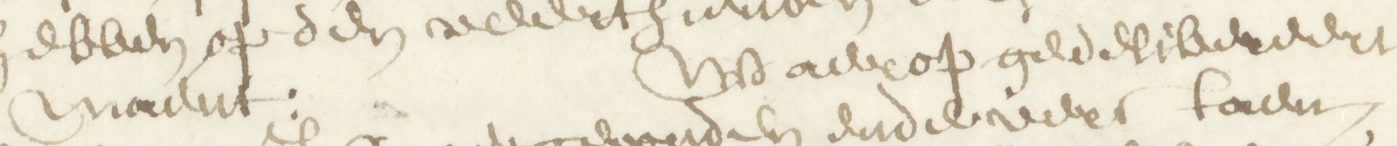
maent: Waerop gedelibereert
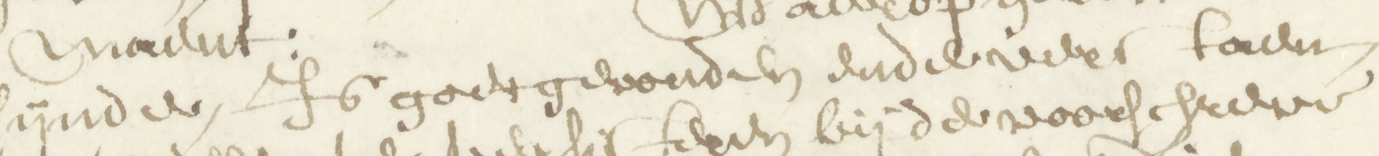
sijnde, Is goetgevonden ende verstaen,
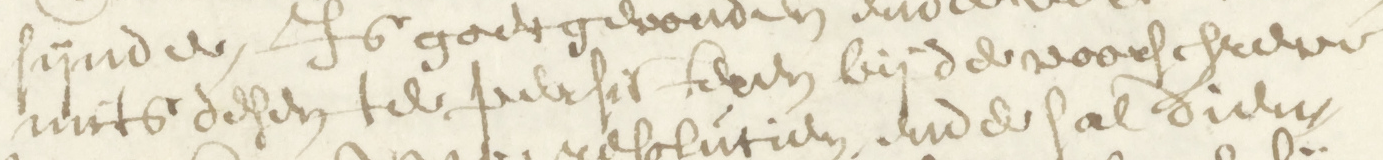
mits desen te persisteren bij de voorschreve
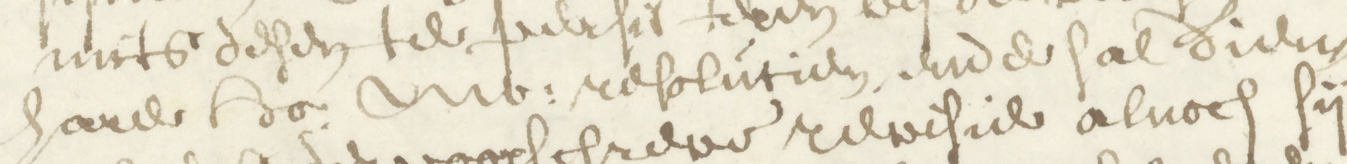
hare Ho:Mo: resolutien, ende sal dien„
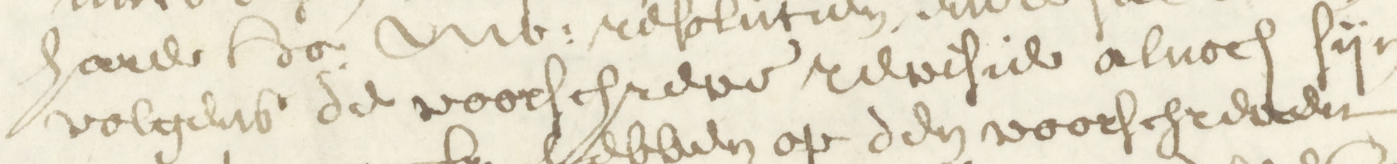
volgens de voorschreve revisie alnoch sijn
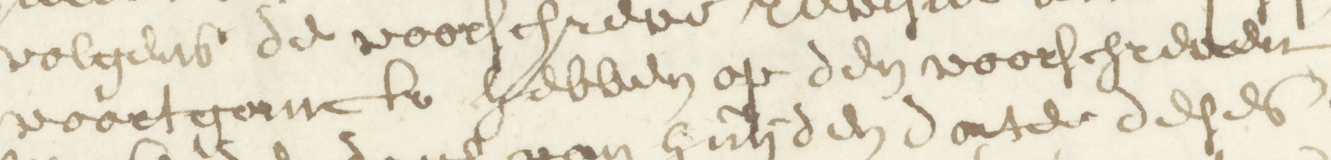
voortganck hebben op den voorschreven
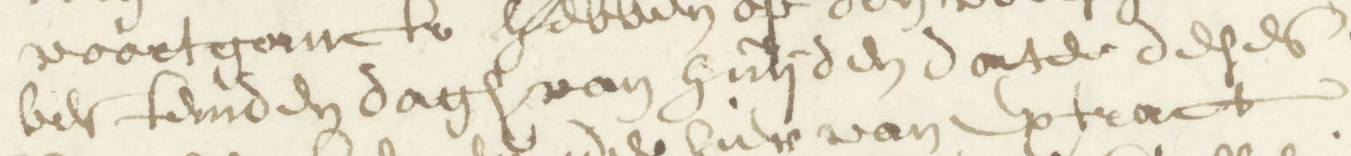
bestenden dagh van huijden date deses:
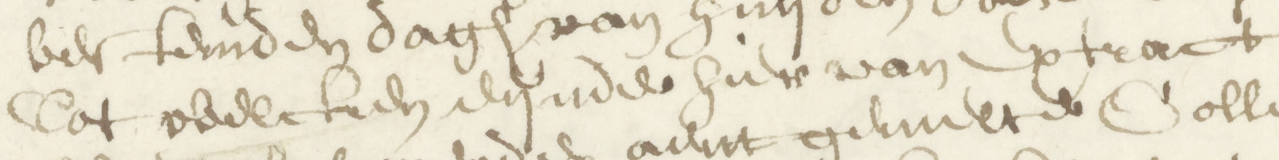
Tot welcken eijnde hier van Extract
